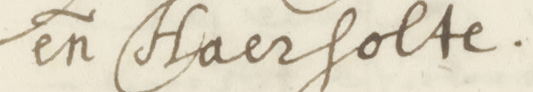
en Haersolte.
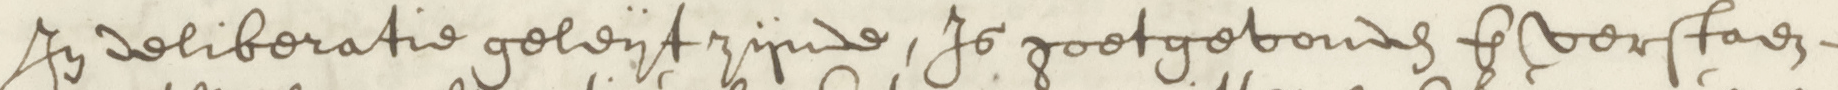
In deliberatie geleijt zijnde, Is goetgevonden & verstaen
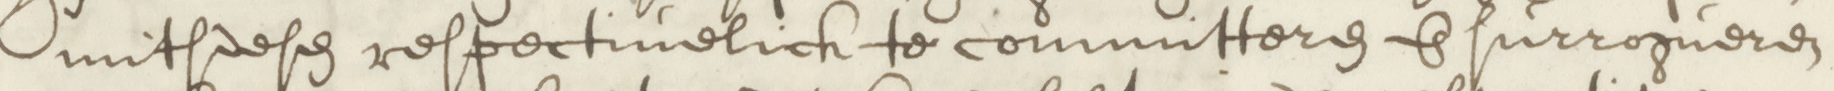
mitsdesen respectiuelick te committeren & surrogueren
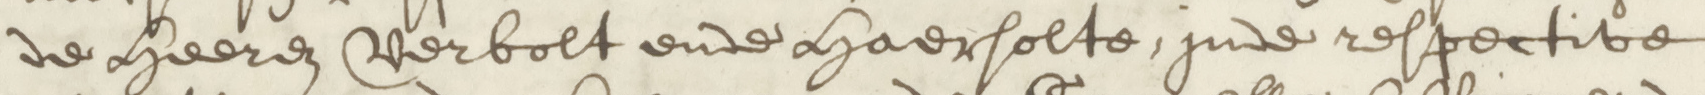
de Heeren Verbolt ende Haersolte, inde respective
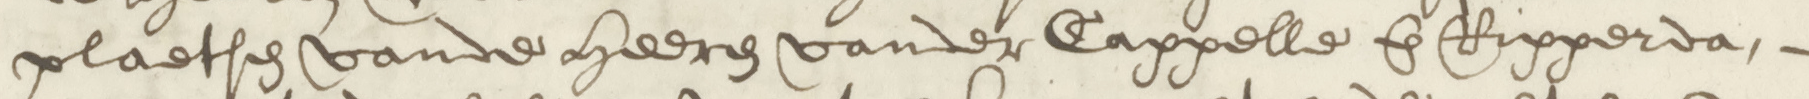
plaetsen vande Heeren vander Cappelle & Ripperda, -
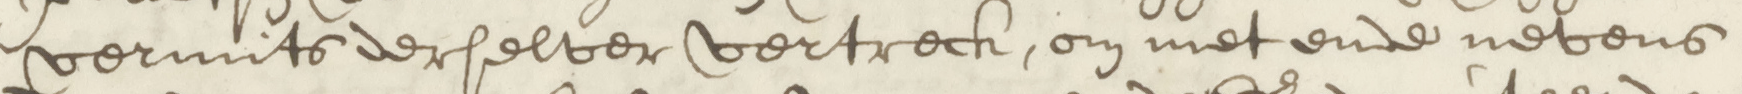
vermits derselver vertreck, om met ende nevens
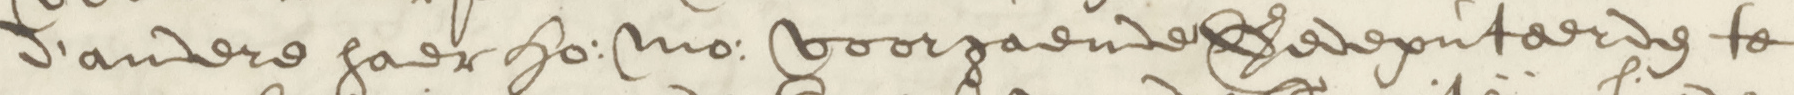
d'andere haer Ho:Mo: voorgaende Gedeputeerden te
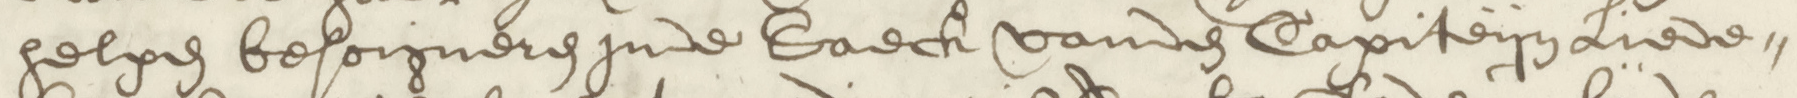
helpen besoigneren inde Saeck vanden Capiteijn Liede„
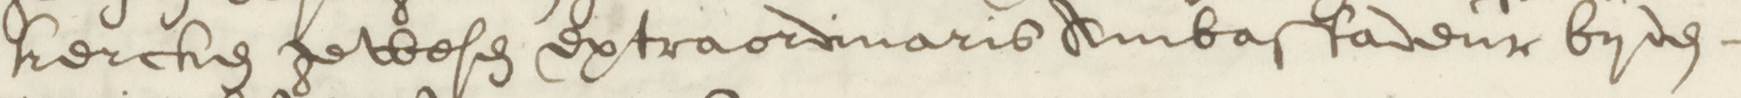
kercken gewesen Extraordinaris Ambassadeur bijden
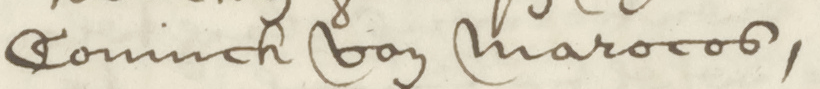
Coninck van Marocos.
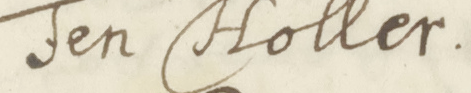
Ten Holler.
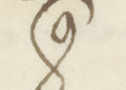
Ca
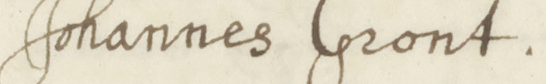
Johannes Gront.
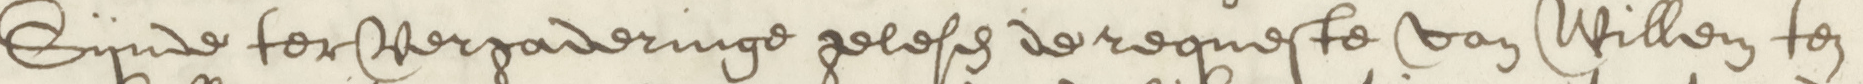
Sijnde ter Vergaderinge gelesen de requeste van Willem ten
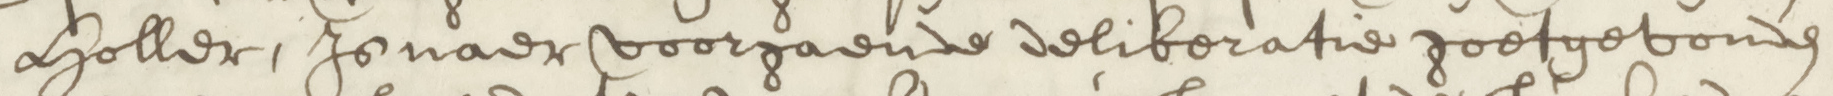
Holler. Is naer voorgaende deliberatie goetgevonden
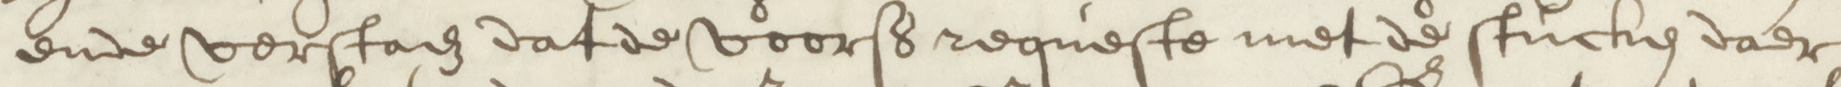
ende verstaen dat de voors requeste met de stucken daer
